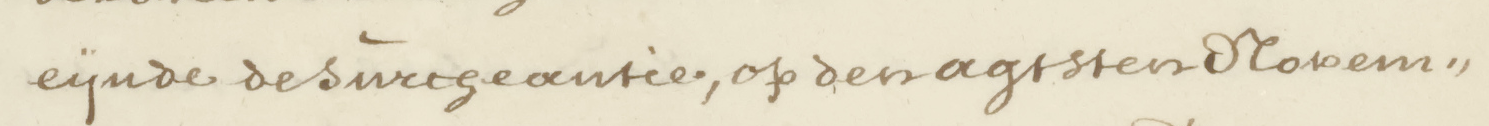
eijnde de surcheantie, op den agtsten Novem„
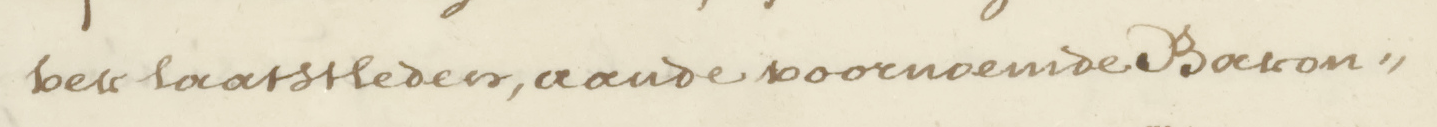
ber laatstleden, aande voornoemde Baron„
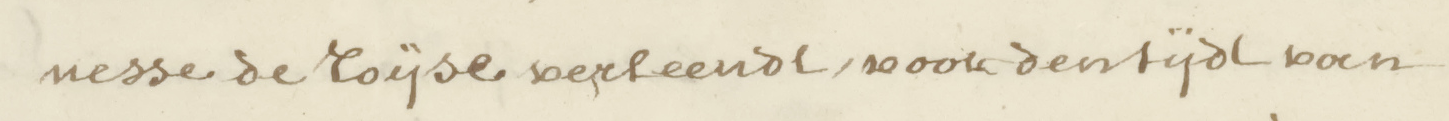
nesse de Roijse verleendt, voor den tijdt van
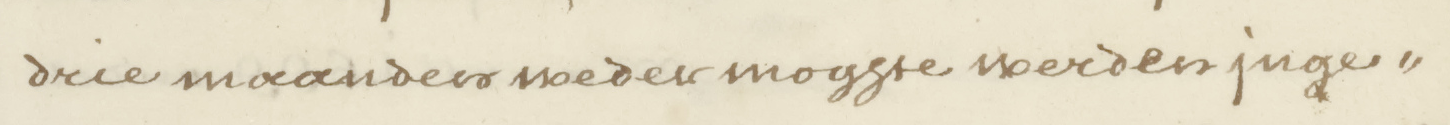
drie maanden weder moghte werden inge„
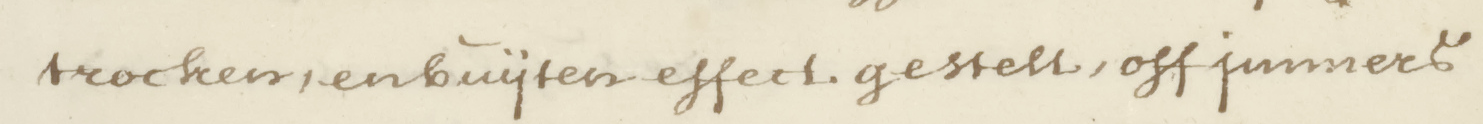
trocken, en buijten effect gestelt, off immers
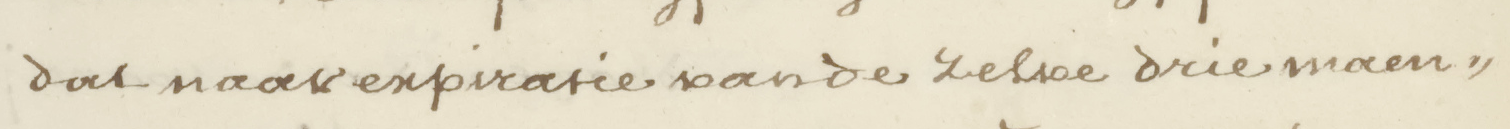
dat naar expiratie van de zelve drie maen„
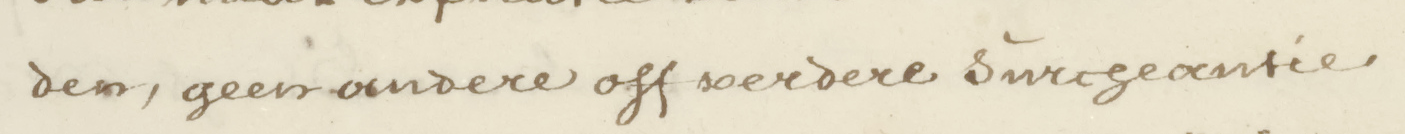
den, geen andere off verdere surcheantie
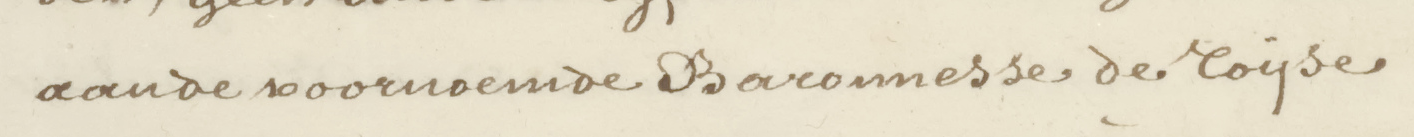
aande voornoemde Baronnesse de Roijse
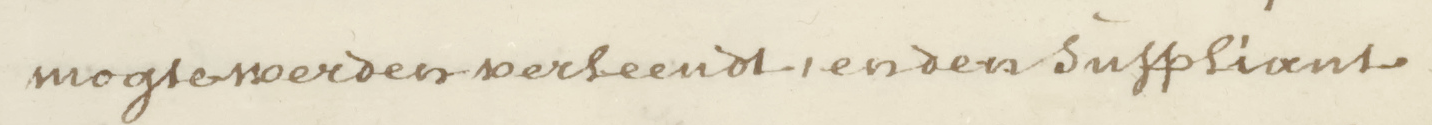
mogte werden verleendt, enden suppliant
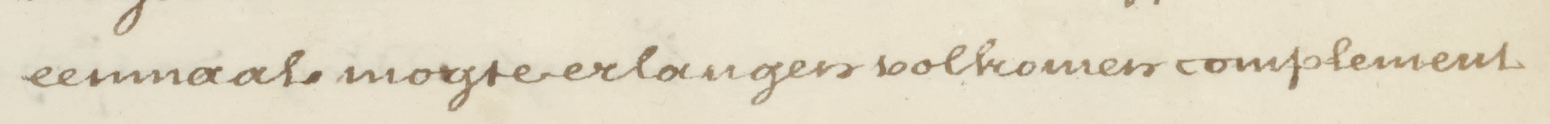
eenmaal mogte erlangen volkomen complement
